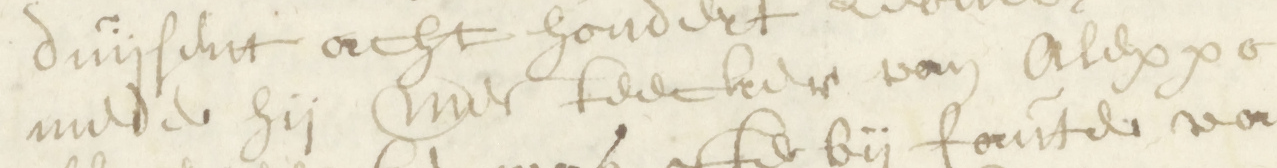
mede hij Mesteecker van Aleppo
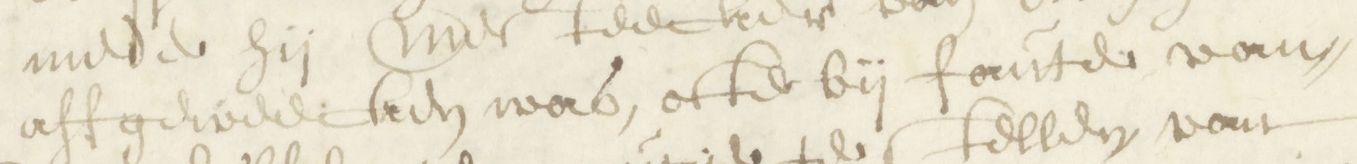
affgeweecken was, ofte bij faute van„
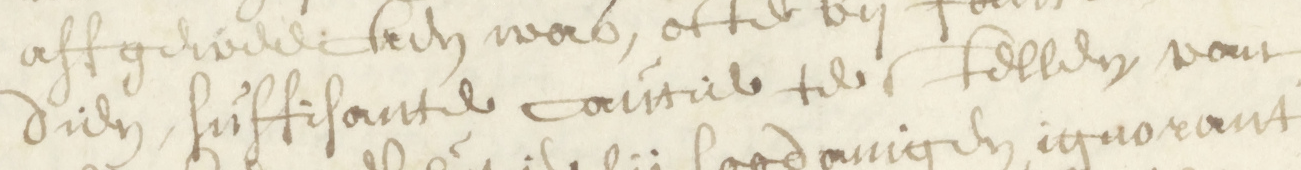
dien, suffisante cautie te stellen, van
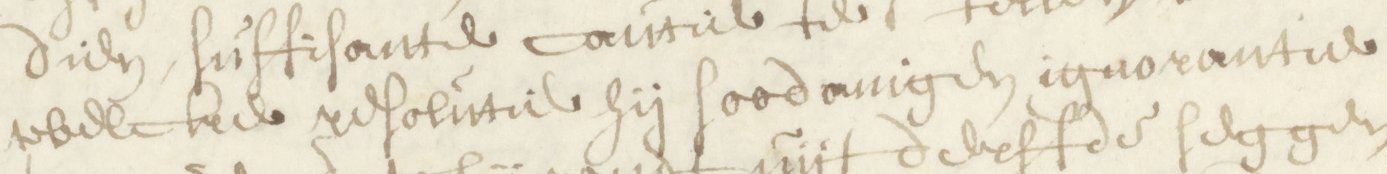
welcke resolutie hij soodanigen ignorantie
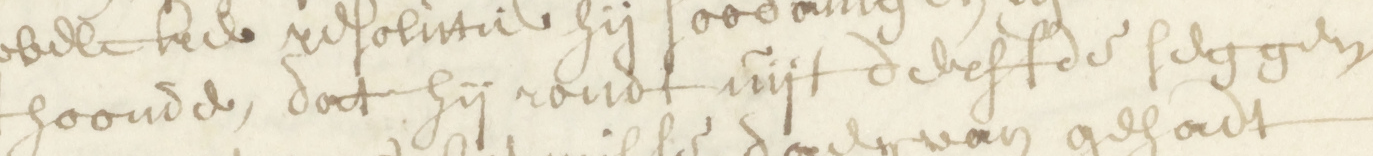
thoonde, dat hij rondt uijt derffde seggen
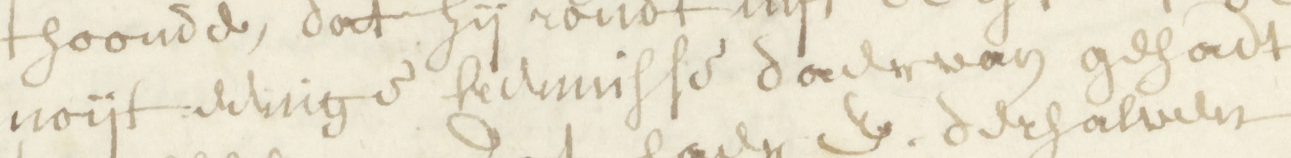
noijt eenige kennisse daervan gehadt
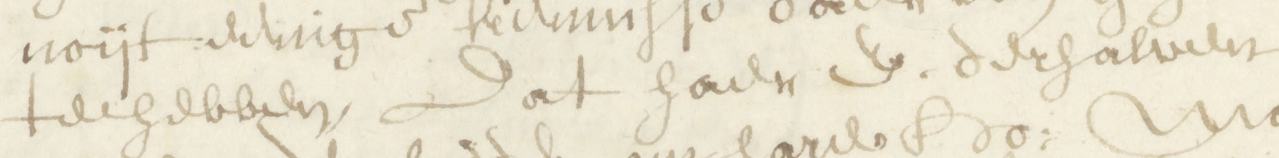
te hebben. Dat haer E. derhalven
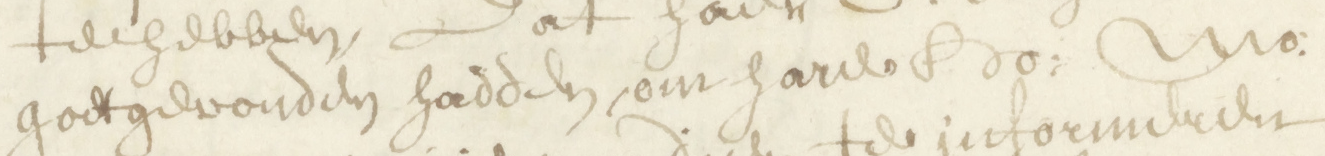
goetgevonden hadden, om hare Ho:Mo:
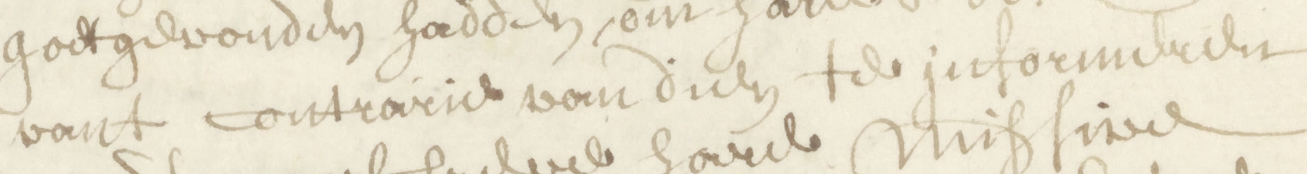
vant contrarie van dien te informeren
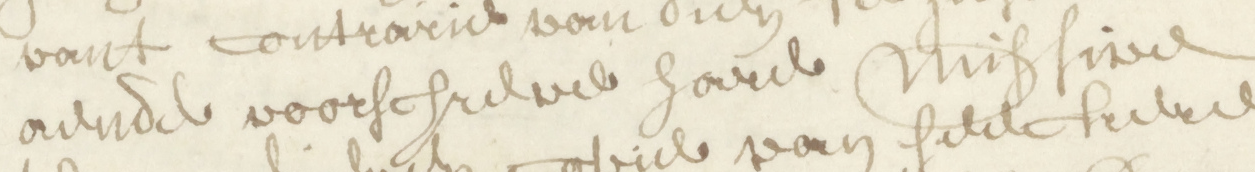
aende voorschreve hare Missive
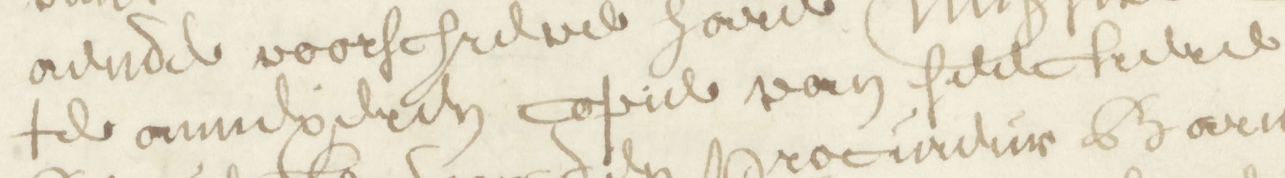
te annexeren copie van seeckere
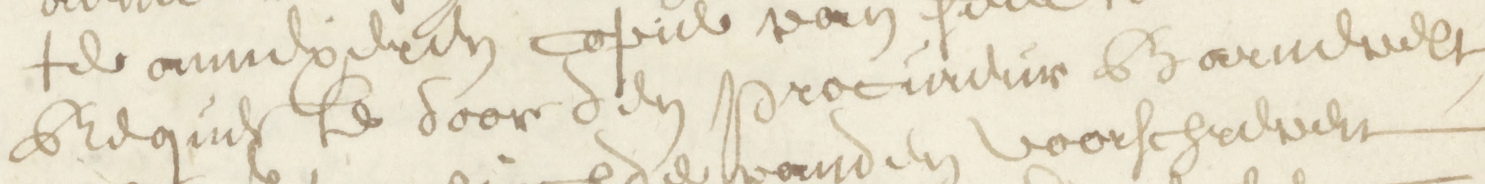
Requeste door den Procureur Barnevelt
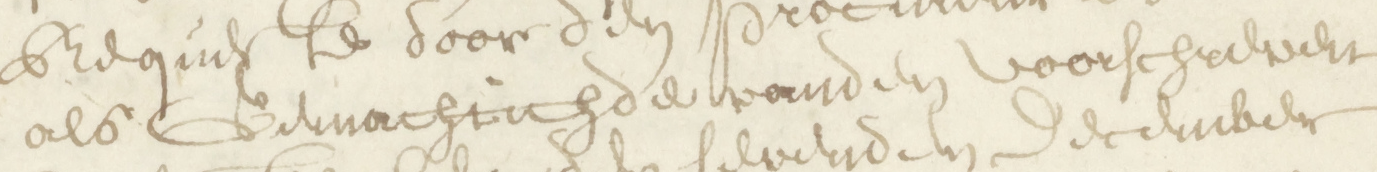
als Gemachtichde vanden voorschreven
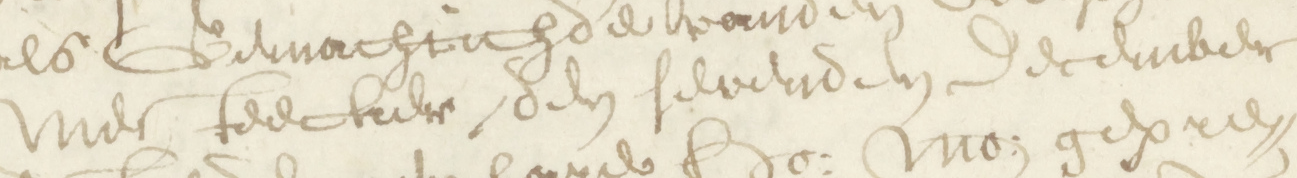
Mesteecker, den sevenden December
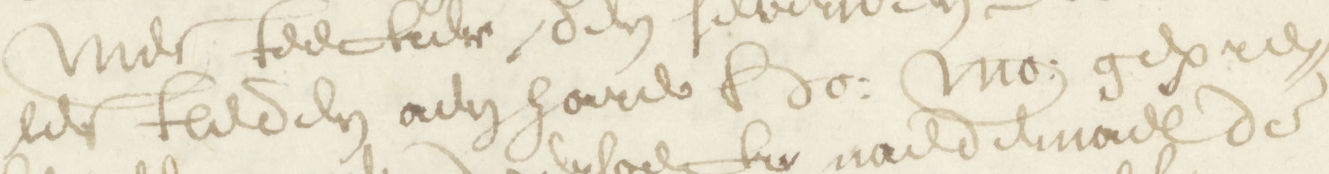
lestleden aen hare Ho:Mo: gepre„
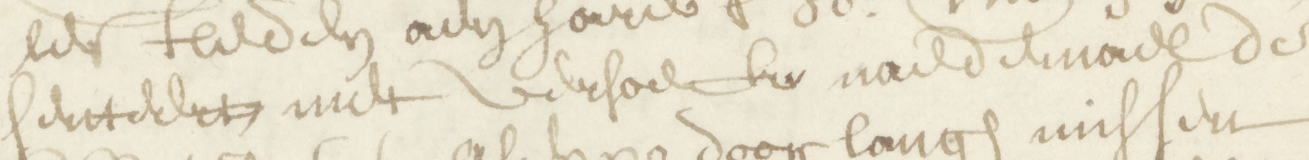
senteert, met versoeck naedemael de
